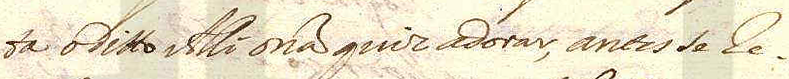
ta o ditto Alli o naõ quiz adorar, antes se Re
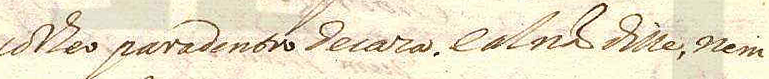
colheo para dentro de caza. E al naõ disse, nem
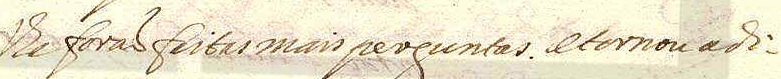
lhe foraõ feitas mais perguntas. E tornou a di
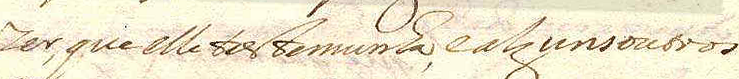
zer, que elle testemunha, e alguns outros
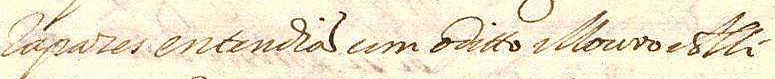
Rapazes entendiaõ com o ditto Mouro Alli
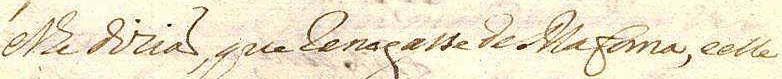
e lhe diziaõ, que Renegasse de Mafoma, e elle
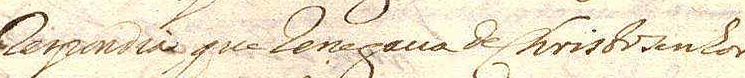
Respondia, que Renegaua de Christo senhor
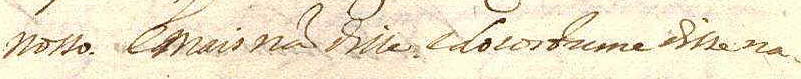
nosso. E mais naõ disse. e do costume disse na
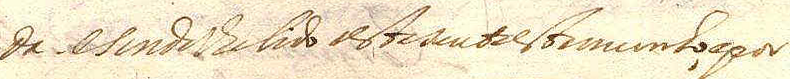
da. e sendolhe lido este seu testemunho, e por
